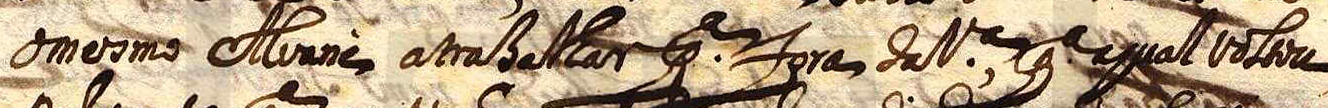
o mesmo Alvanè a trabalhar p.a fora da V.a, p.a a qual voltou
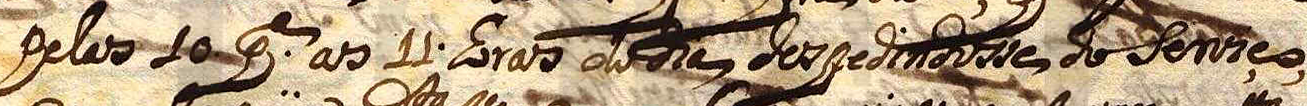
pelas 10 p.a as 11. horas do dia despedindosse do serviço,
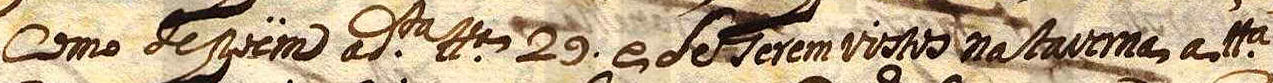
como depoem a d.ta tt.a 29. e de serem vistos na taverna a tt.a
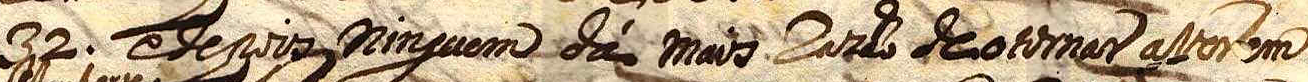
32. e depois ninguem dá mais Razão de o tornar a Ver em
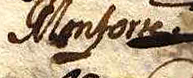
Monforte
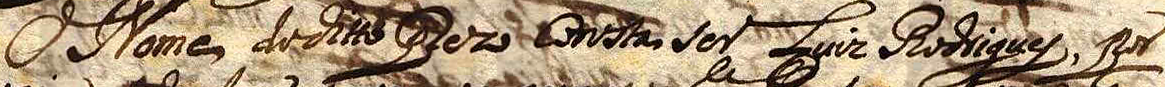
O Nome do ditto pRezo consta ser Luiz Rodrigues, por
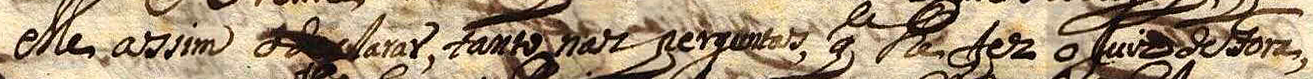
elle assim o declarar, tanto naz perguntas, q̄ lhe fez o Juiz de Fora,
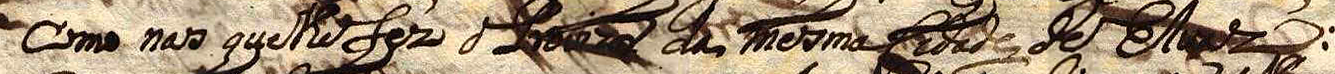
como nas que lhe fez o Provizor da mesma Cidade de Elvaz:
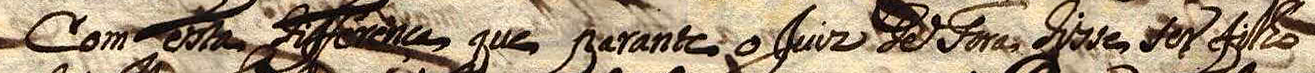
Com esta differença que parante o Juiz de Fora disse ser filho
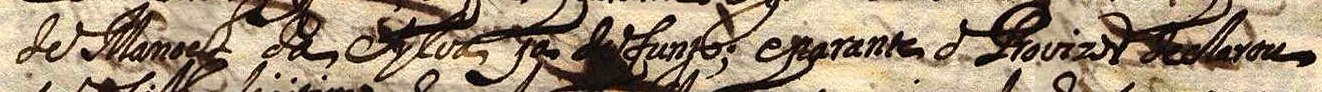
de Manoel da Sylva ja defunto; e parante o Provizor declarou
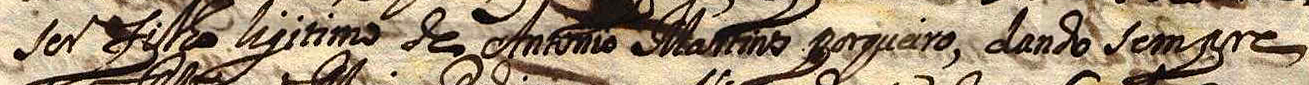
ser filho ligitimo de Antonio Martins porqueiro, dando sempre
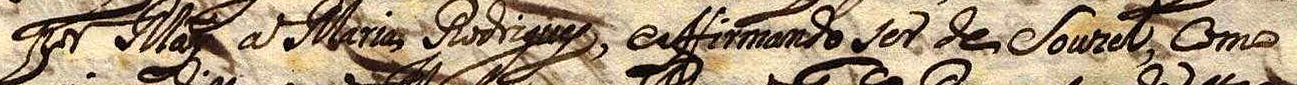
por May a Maria Rodrigues, e affirmando ser de Souzel, como
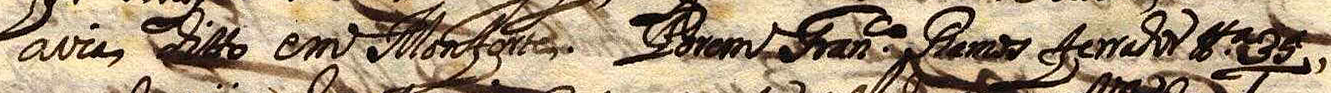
avia ditto em Monforte. Porem Fran.co Ramos ferrador tt.a 35,
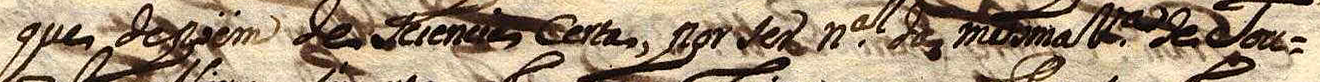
que depoem de sciencia certa, por ser n.al da mesma V.a de Sou
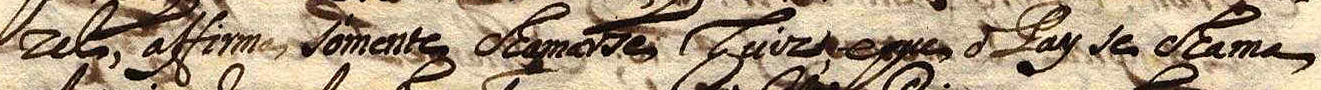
zel, affirma somente chamarse Luiz, e que o Pay se chama
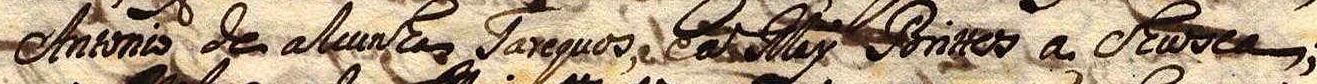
Antonio de alcunha Tarequos, e a May Brittes a chusca;
